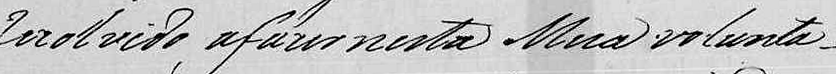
rezolvido a fazer nesta Mesa volunta
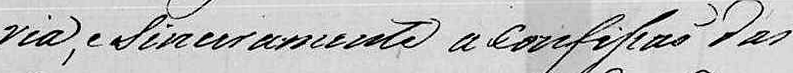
ria, e sinceramente a confissaõ das
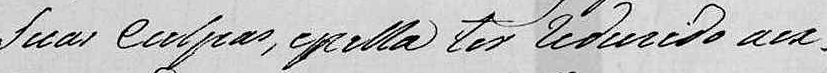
suas culpas, e pella ter reduzido a es
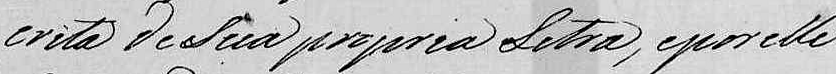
crita de sua propria letra, e por elle
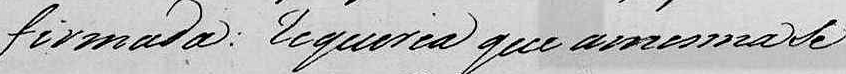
firmada: Requeria que a mesma se
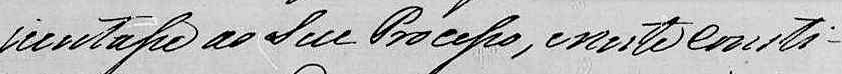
juntasse ao seu Processo, e neste consti
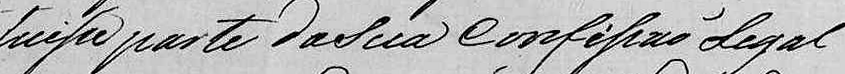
tuisse parte da sua confissaõ legal
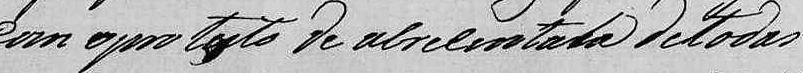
com o protesto de acrecentada de todas
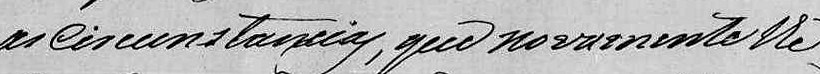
as circunstancias, que no novamente lhe
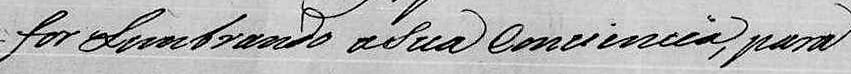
for lembrando a sua consciencia, para
